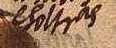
e soltras
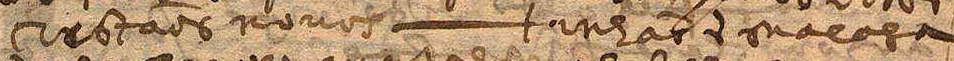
cristãos nouos tinhaõ ē sua casa
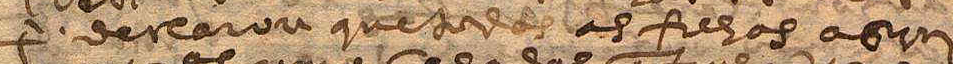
E declarou que todas as filhas asyn
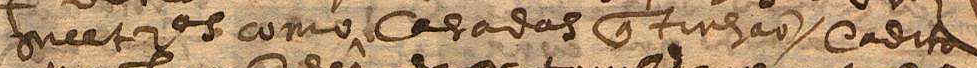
solltras como Casadas q̄ tinhaõ / e a dita
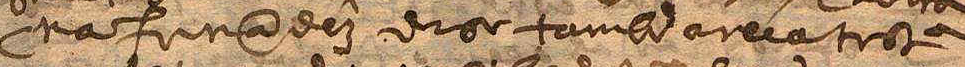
Cna fernādez dise tambē a ella testa
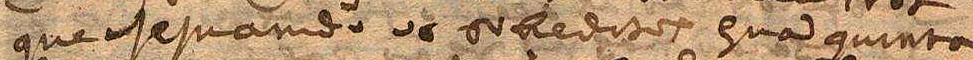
que Jejuando os sobreditos huā quinta
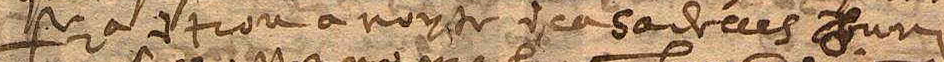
fra ētrou a noyte ē casa delles hum
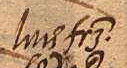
luis frz̄.
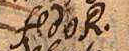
fo do R.
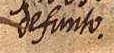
defunto.
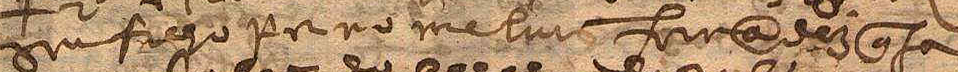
seu filho por nome luis fernādez q̄ Ja
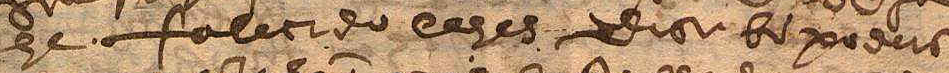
he falecido e lhes dise bē podeis
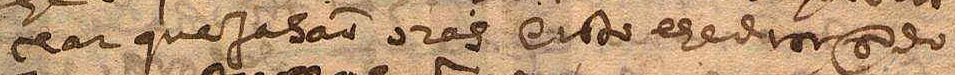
cear que Ja saõ oras e isto lhe dise sēdo
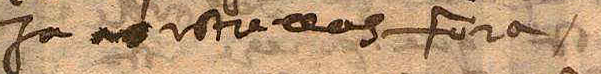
Ja as estrellas fora /
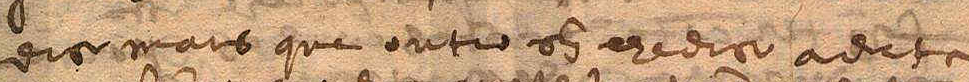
dise mais que outrosy lhe dise a dita
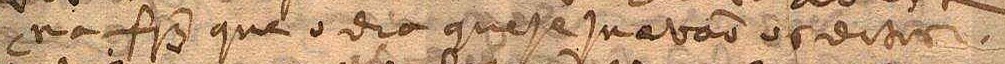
cna frz̄ que o dia que JeJuavaõ os ditos
